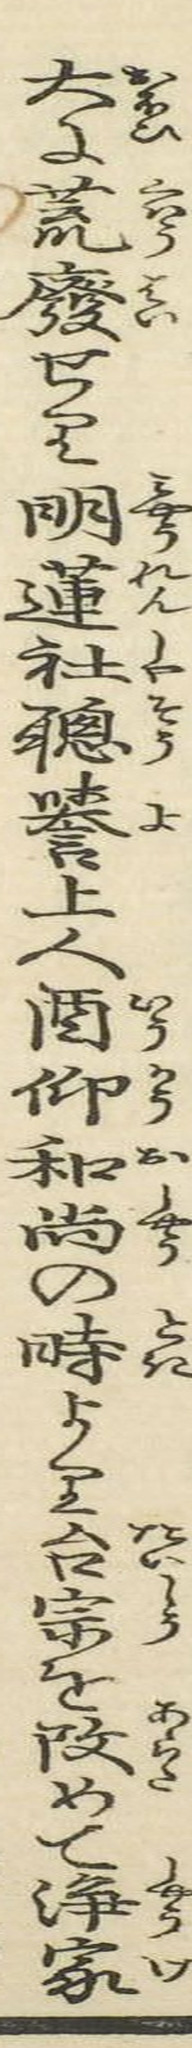大に荒廃せり明蓮社聡誉上人酉仰和尚の時より台宗を改めて浄家
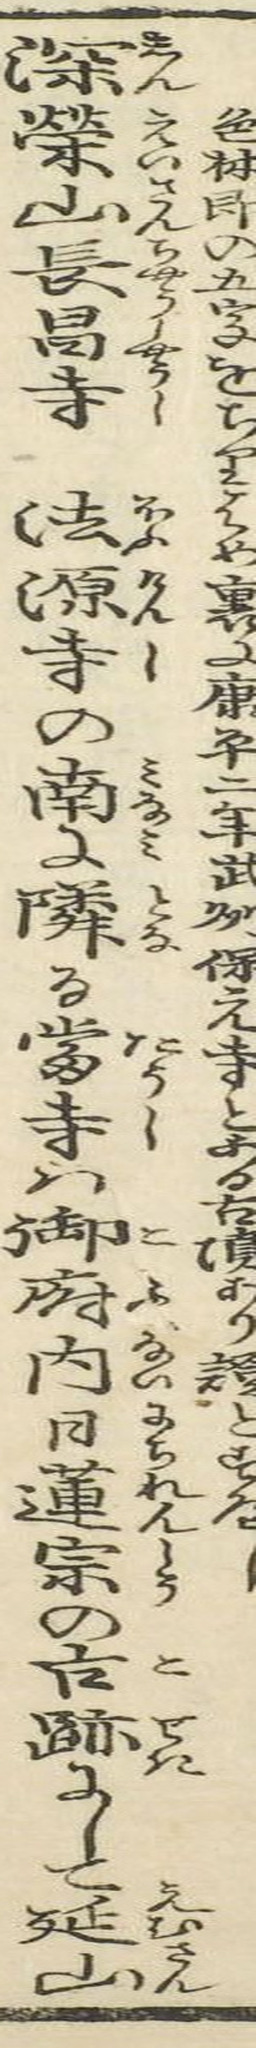深栄山長昌寺法源寺の南に隣る当寺は御府内日蓮宗の古跡にして延山
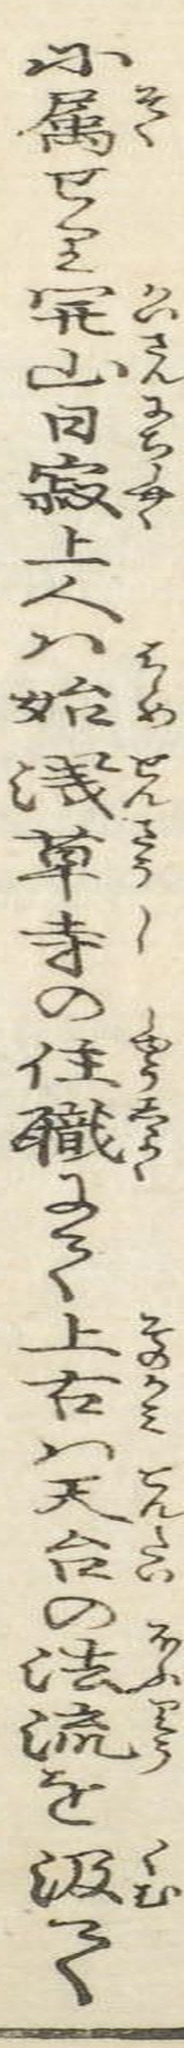に属せり開山日寂上人は始浅草寺の住職にて上古は天台の法流を汲て
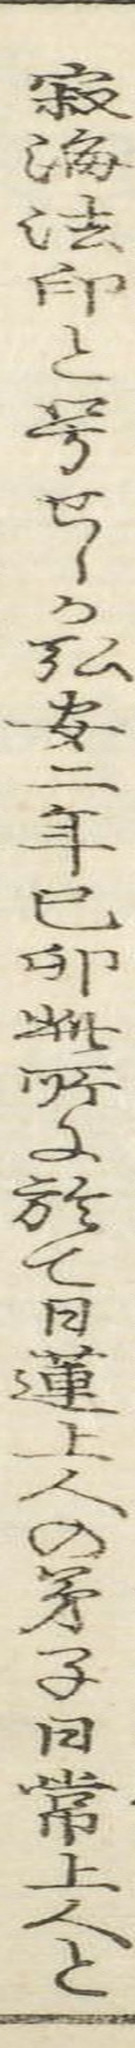寂海法印と号せしか弘安二年己卯此所に於て日蓮上人の弟子日常上人と
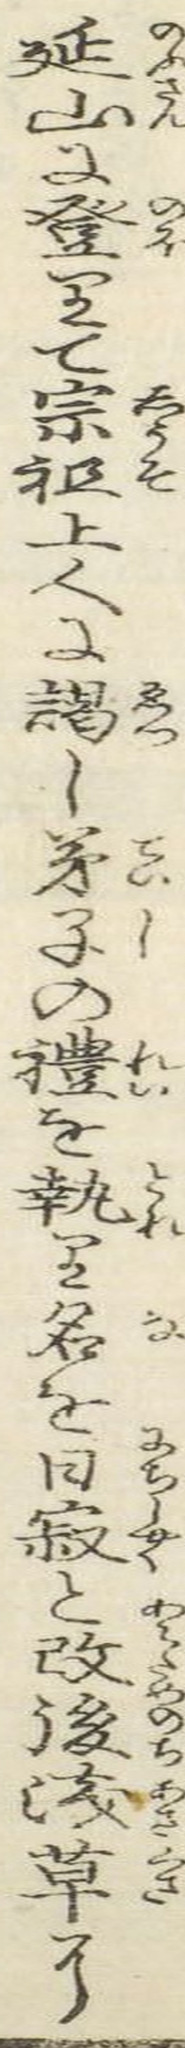延山に登りて宗祖上人に謁し弟子の礼を執り名を日寂と改後浅草に
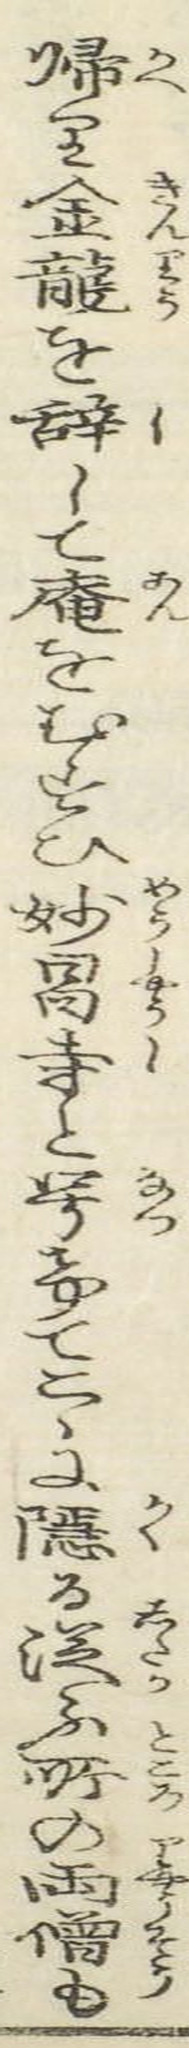帰り金龍を辞して庵をむすひ妙昌寺と号けてこゝに隠る従ふ所の両僧も
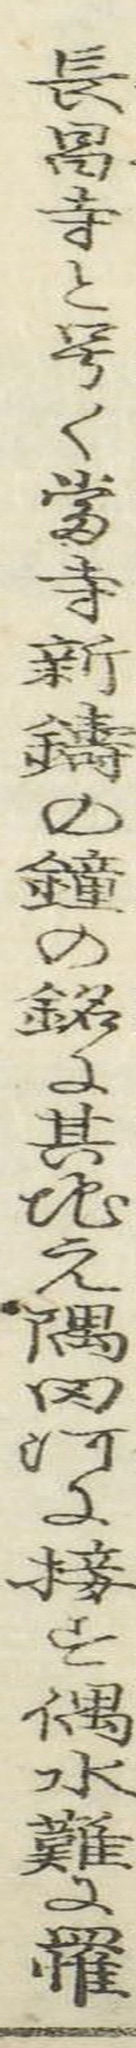長昌寺と号く当寺新鋳の鐘の銘に其地元隅田河に接す偶水難に罹
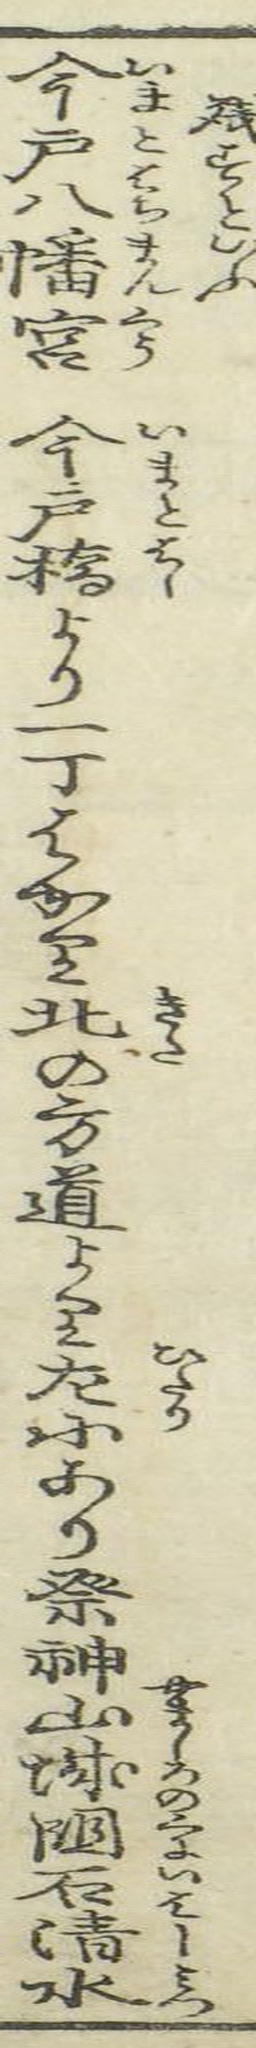今戸八幡宮今戸橋より一丁はかり北の方道より左にあり祭神山城国石清水

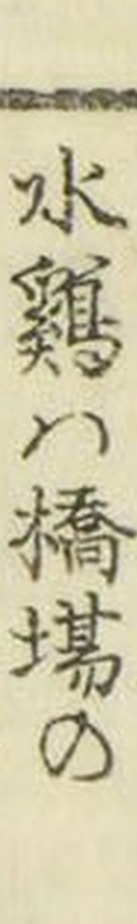水鶏は橋場の
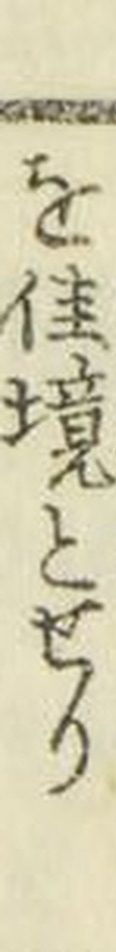を佳境とせり
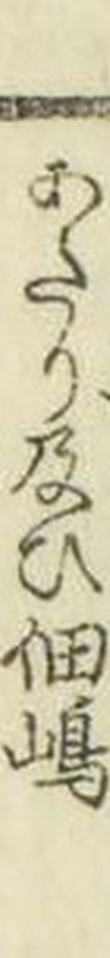あたり及ひ佃嶋
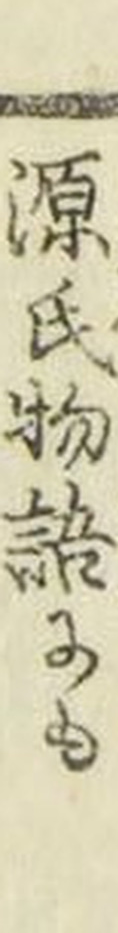源氏物語にも
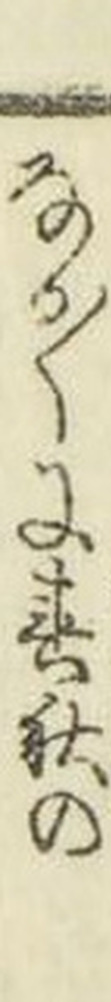なか〳〵に春秋の
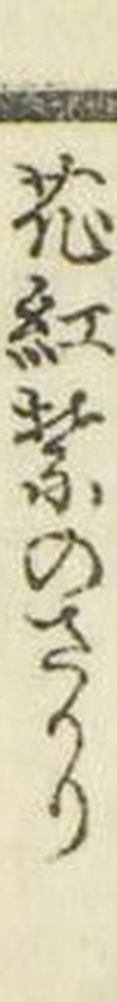花紅葉のさかり
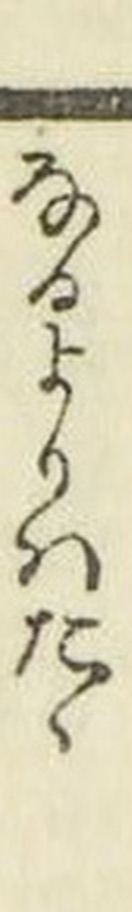なるよりはたゝ
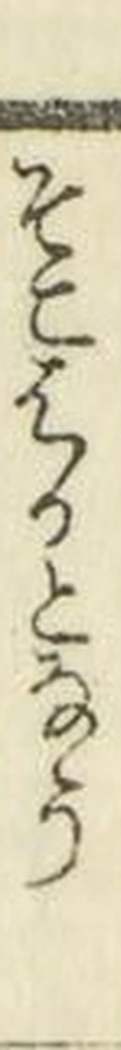そこはかとなう
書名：江戸名所図会 20巻 巻之17
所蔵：東京学芸大学教育コンテンツアーカイブ
